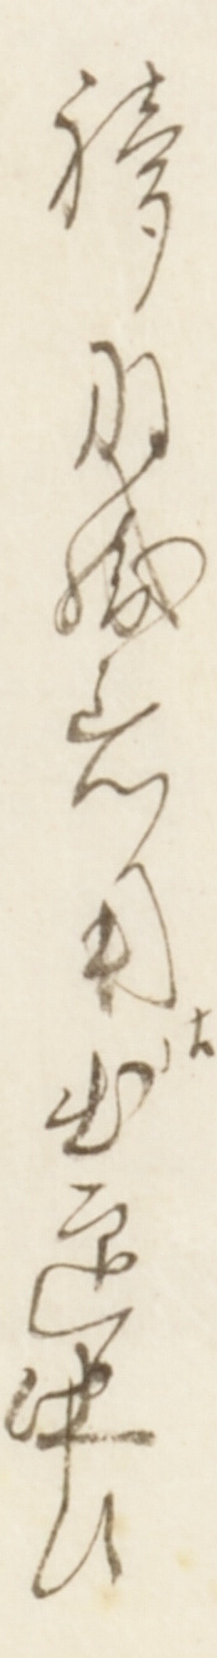袴羽織着用御出迎仕候
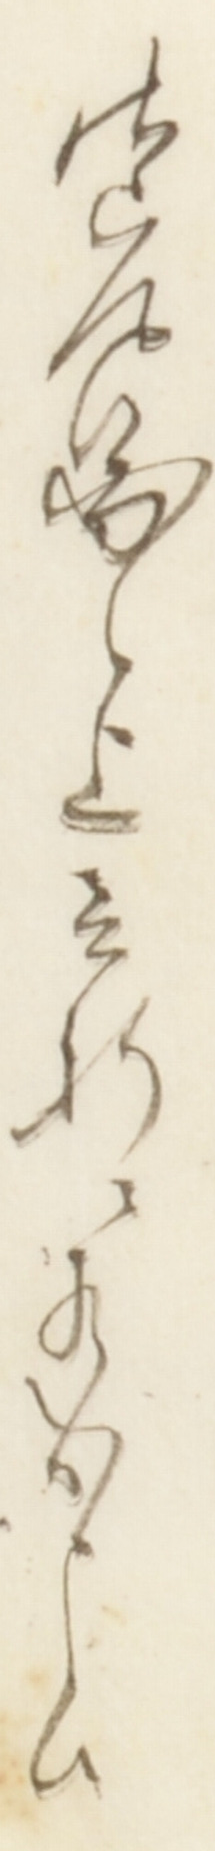御差図之上壱軒ニ相成申候
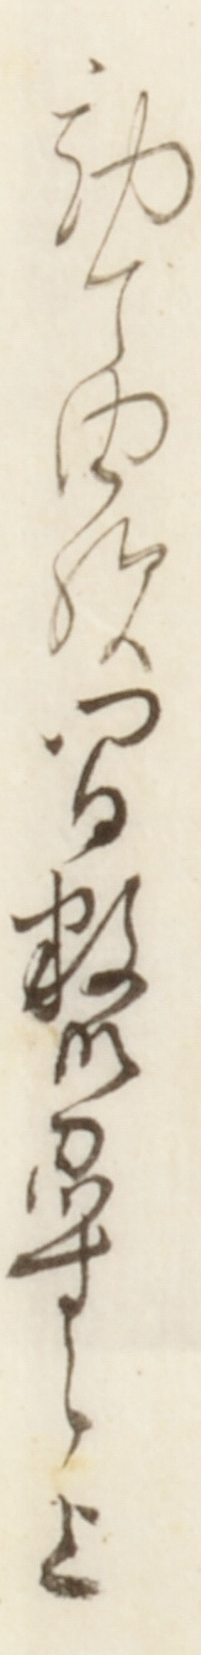勘ケ由様間数御尋之上
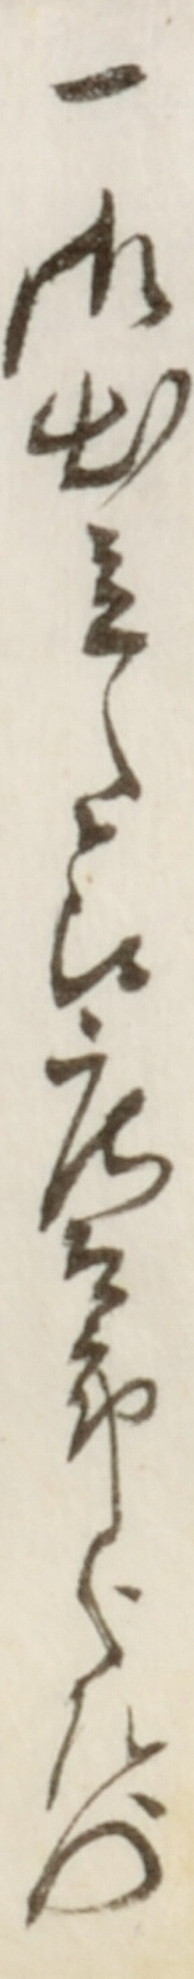一高遠御着之節庄太郎与左衛門

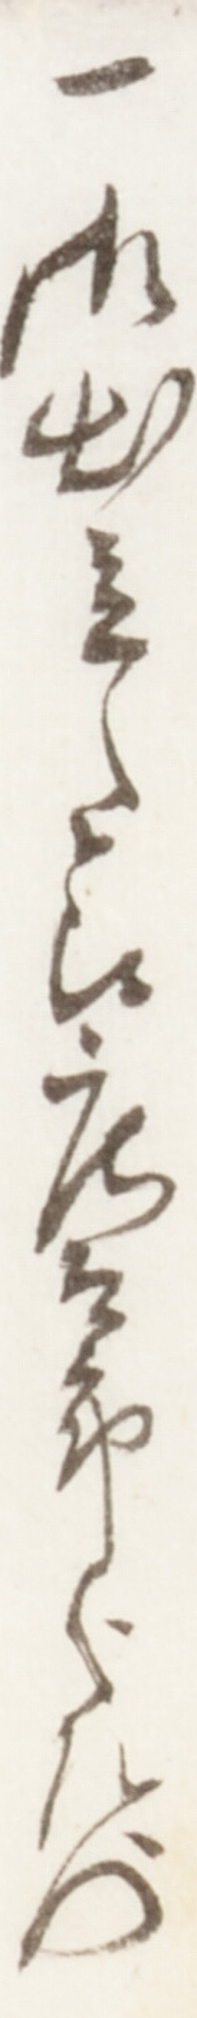一御出立之節庄太郎与左衛門
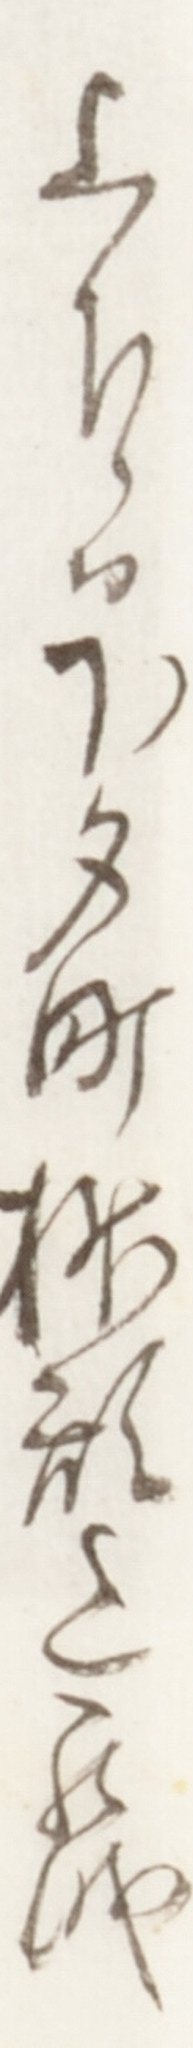上下ニ而下夕町枡形迄罷越
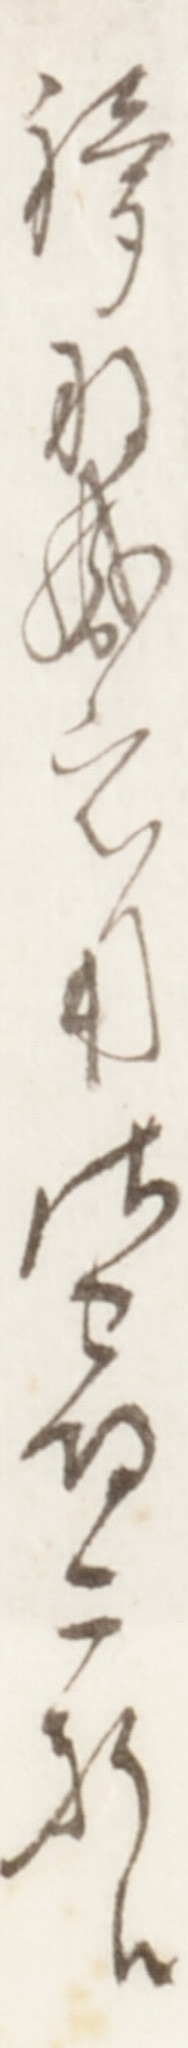袴羽織着用御宿二軒江
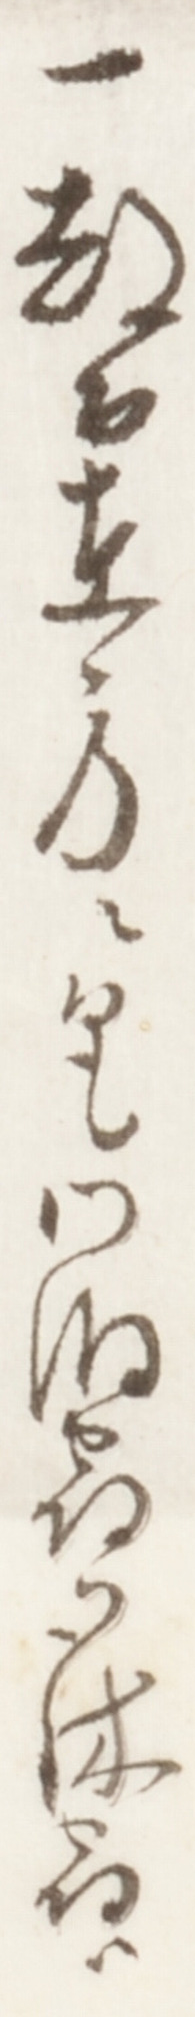一都而在方ニ而も御泊宿御休宿ハ
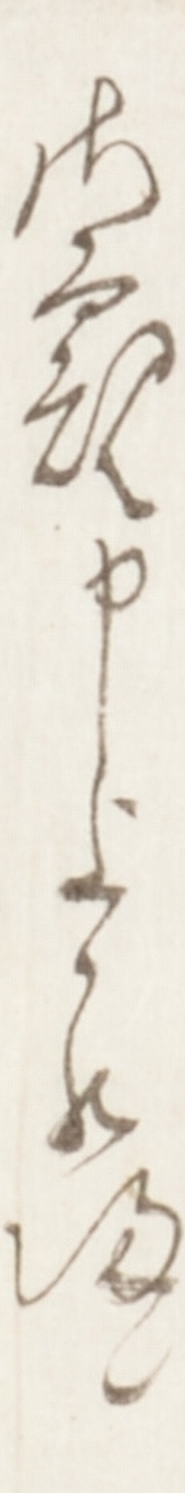御窺申上罷帰候
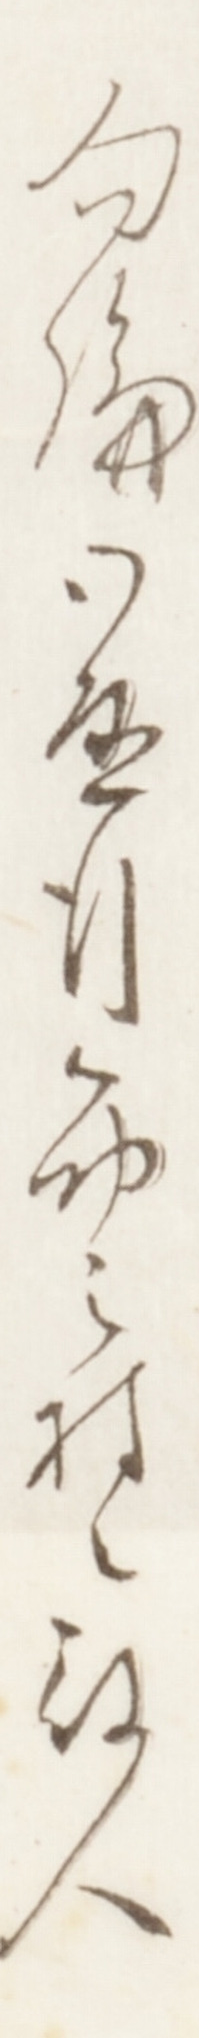勿論御通行筋之村々役人
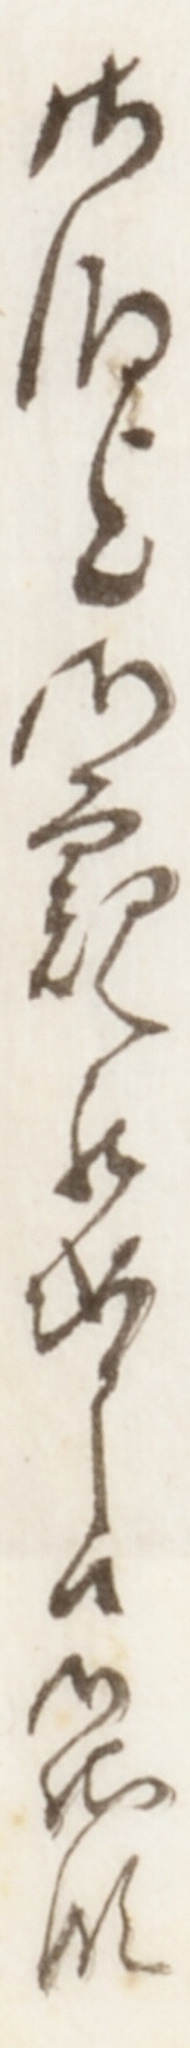御泊迄御窺候出之候御供段も
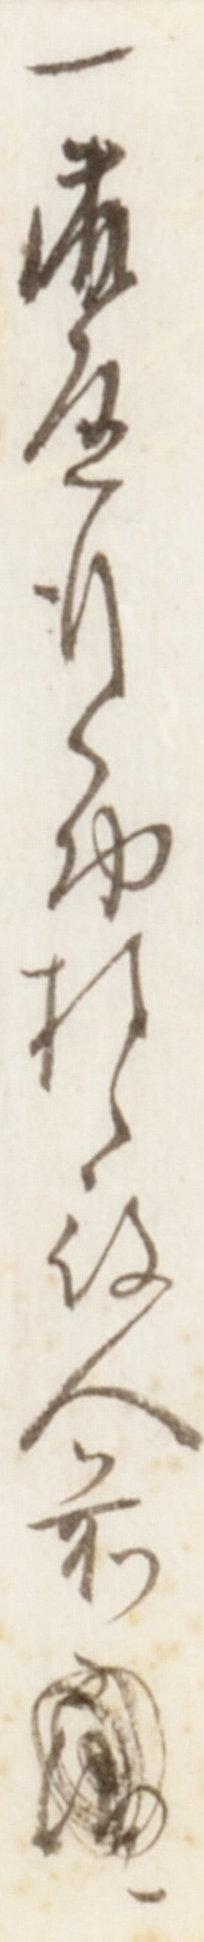一御通行筋村々役人前
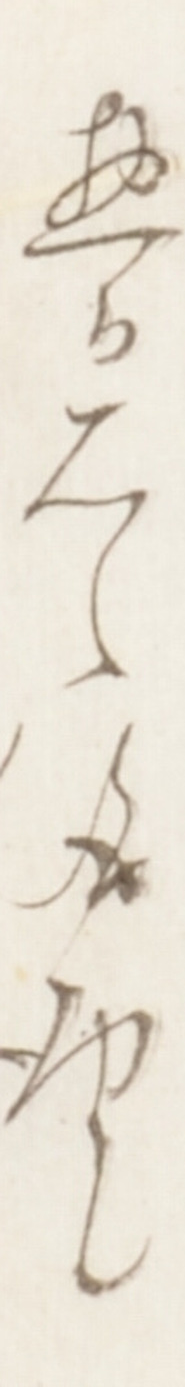惣而右之趣御座候
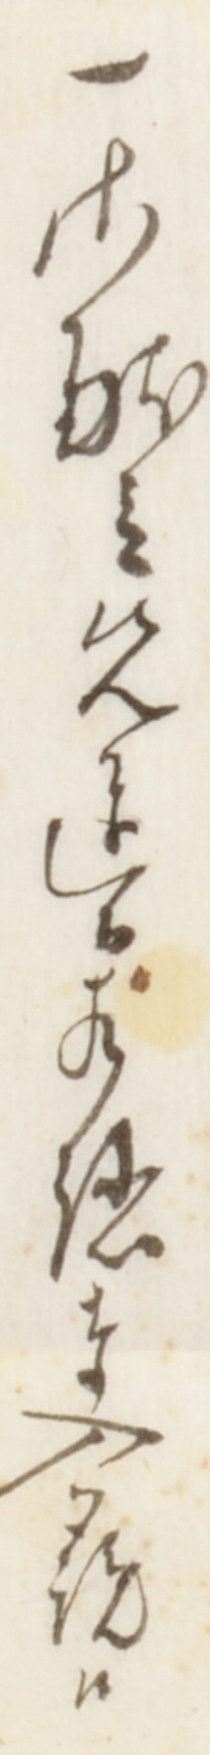一御献立先達而相認奉入御覧候
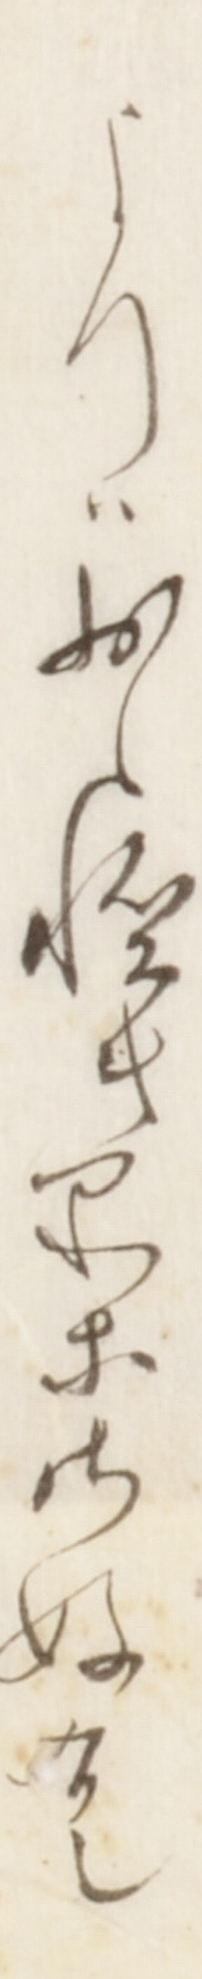よりハ少々軽き品等御好有之
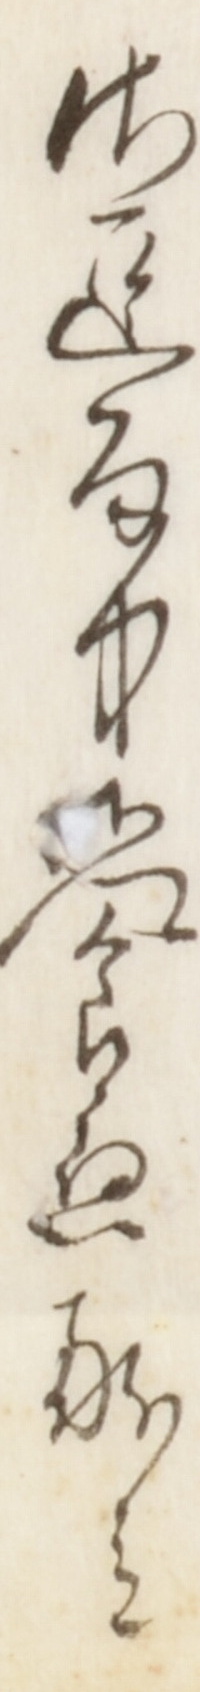御逗留中御饗応献立
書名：御測量諸事控
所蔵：伊那市立高遠町図書館・合同会社AMANE
